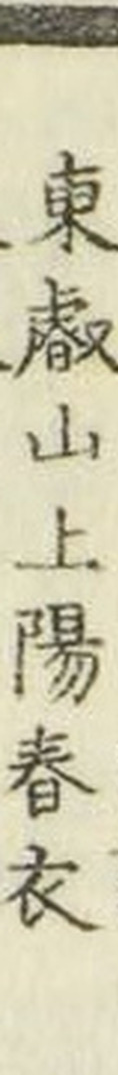東叡山上陽春衣
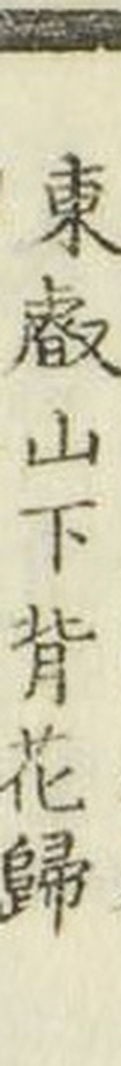東叡山下背花帰
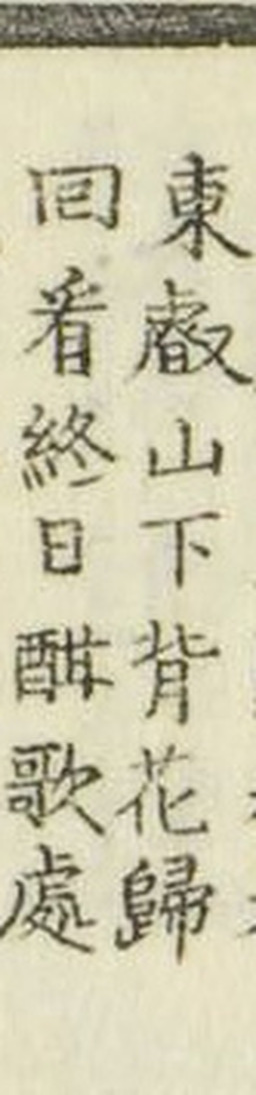回看終日酣歌処
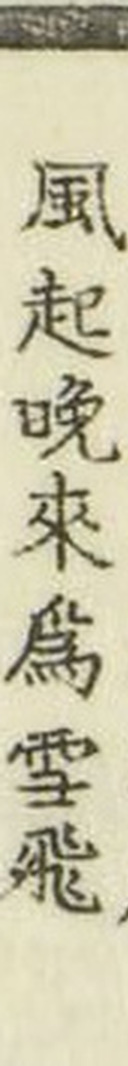風起晩来為雪飛

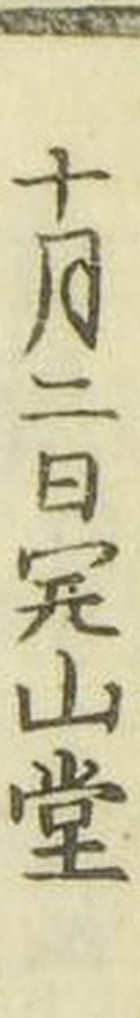十月二日開山堂
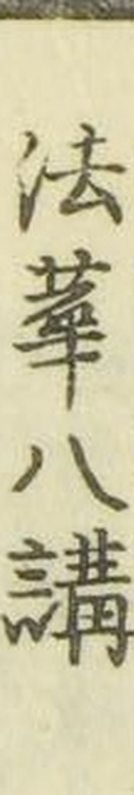法華八講
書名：江戸名所図会 20巻 巻之14
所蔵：東京学芸大学教育コンテンツアーカイブ
